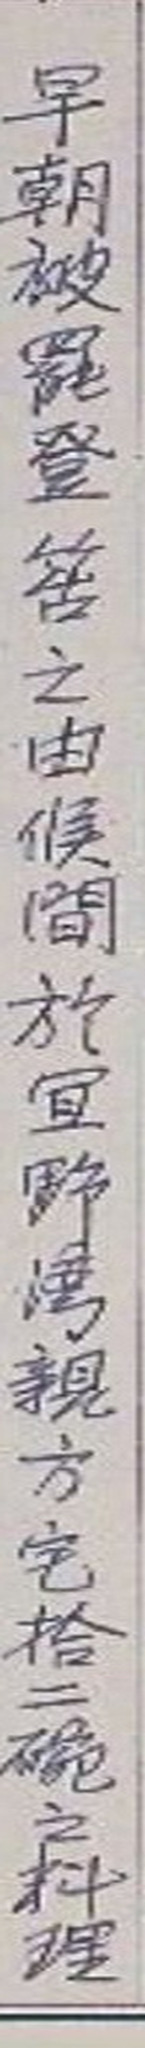早朝被罷登筈之由候間於宜野湾親方宅拾二碗之料理
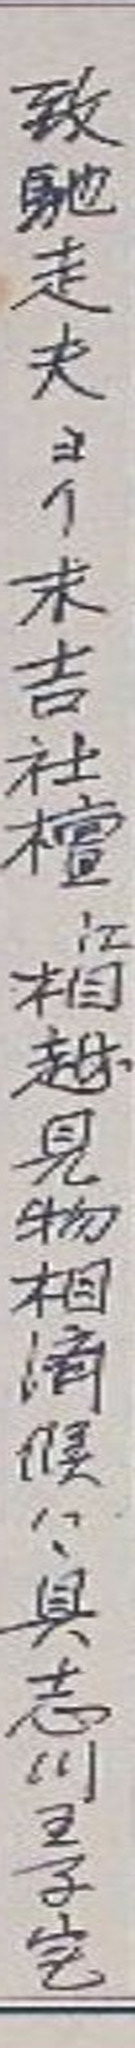致馳走夫より末吉社檀え相越見物相済候はゝ具志川王子宅
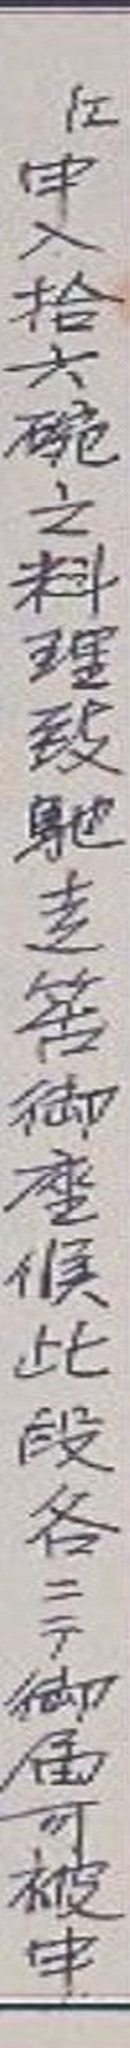え申入拾六碗之料理致馳走筈御座候此段各にて御届可被申
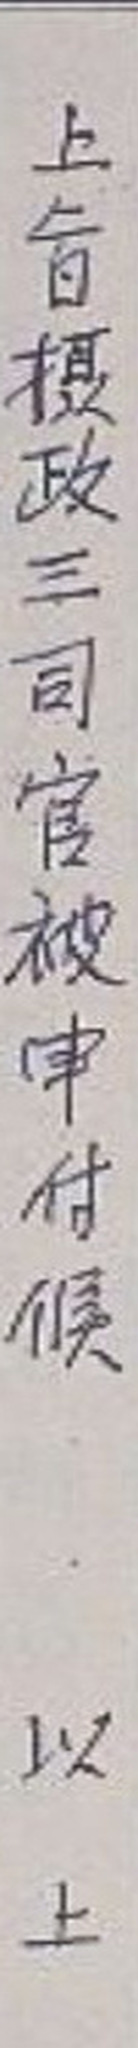上旨摂政三司官被申付候以上
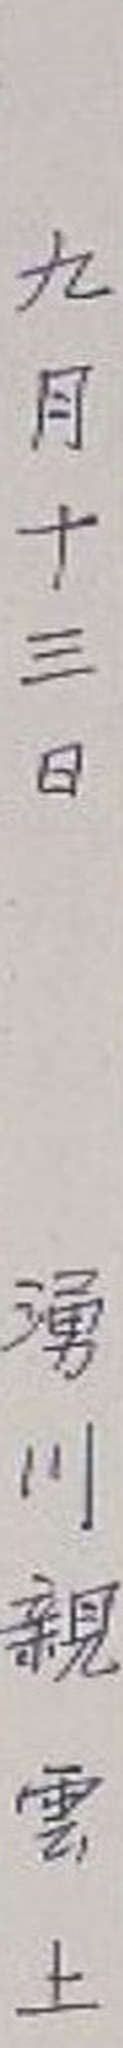九月十三日湧川親雲上
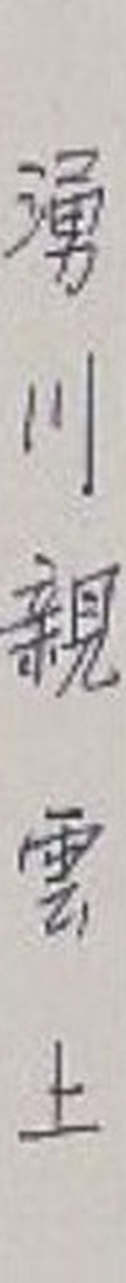湧川親雲上
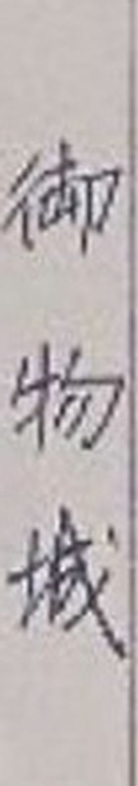御物城
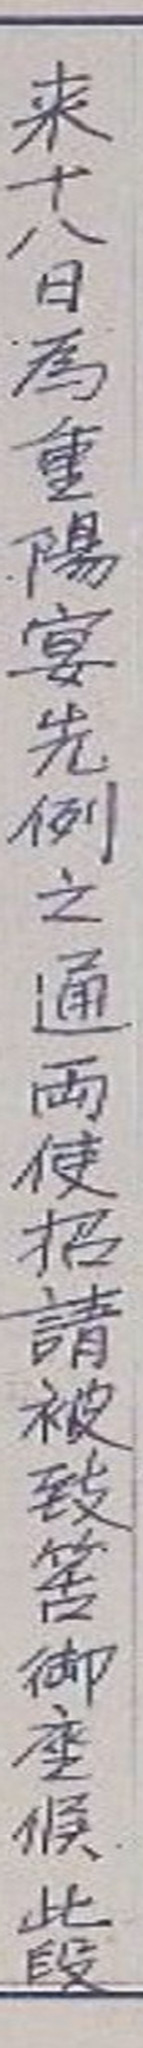来十八日為重陽宴先例之通両使招請被致筈御座候此段

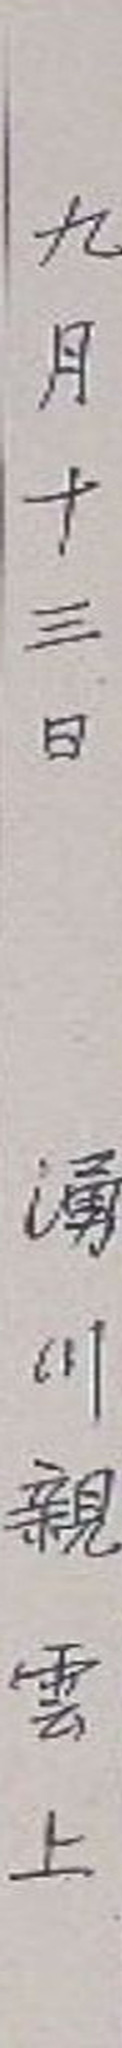九月十三日湧川親雲上
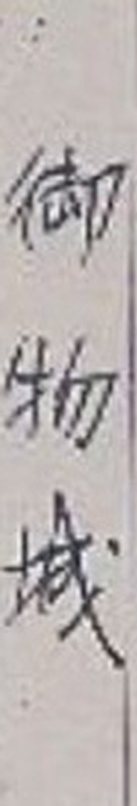御物城
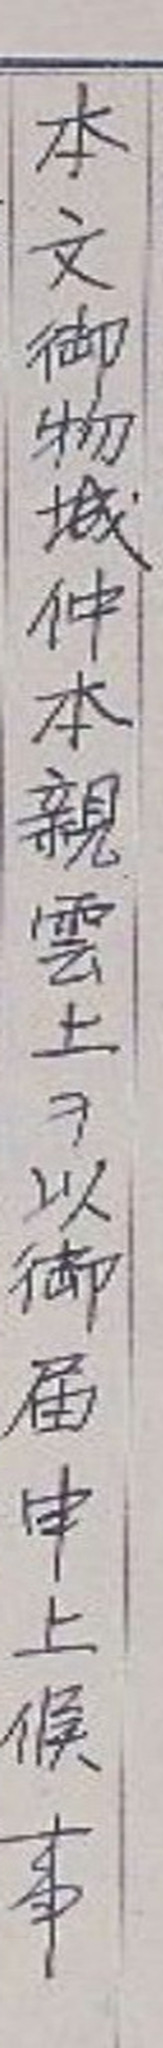本文御物城仲本親雲上を以御届申上候事
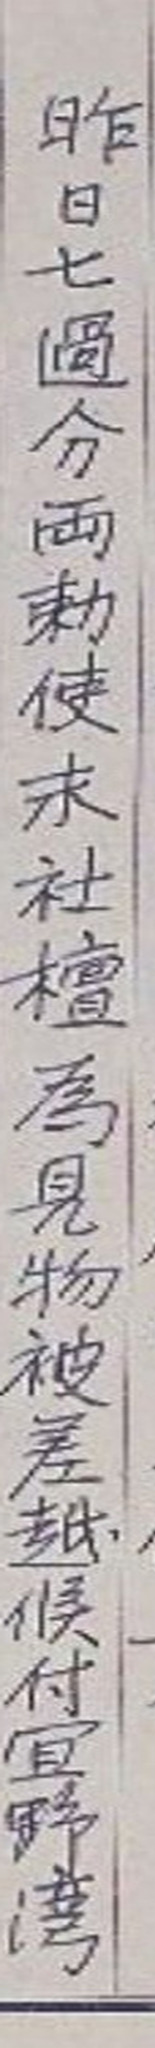昨日七過分両勅使末社檀為見物被差越候付宜野湾
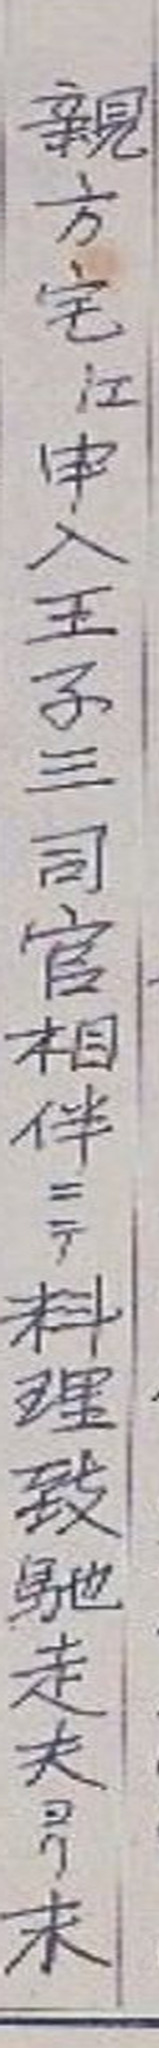親方宅え申入王子三司官相伴にて料理致馳走夫より末
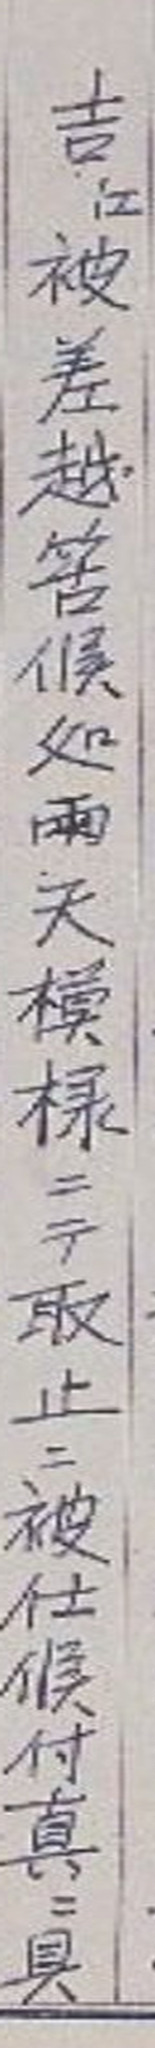吉え被差越筈候処雨天模様にて取止に被仕候付真に具
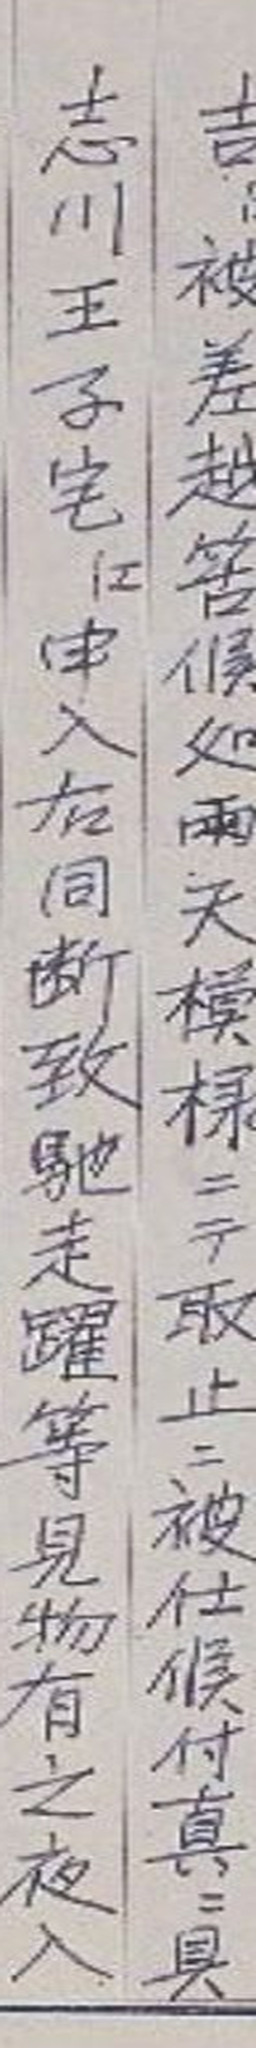志川王子宅え申入右同断致馳走躍等見物有之夜入
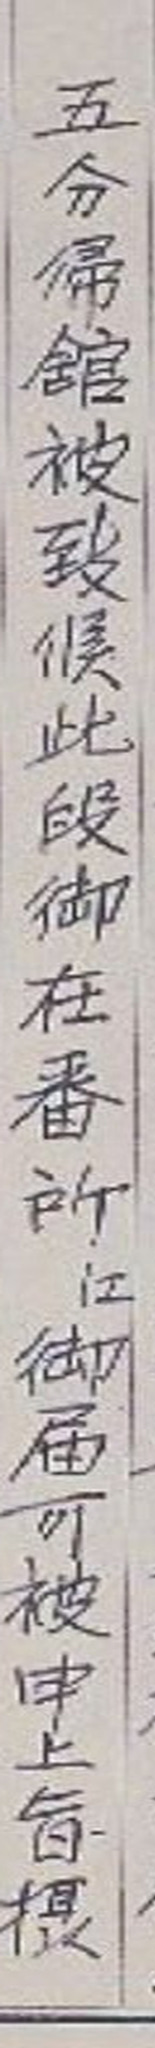五分帰館被致候此段御在番所え御届可被申上旨摂
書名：支那冊封使来琉諸記 下巻
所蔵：University of the Ryukyus Library
